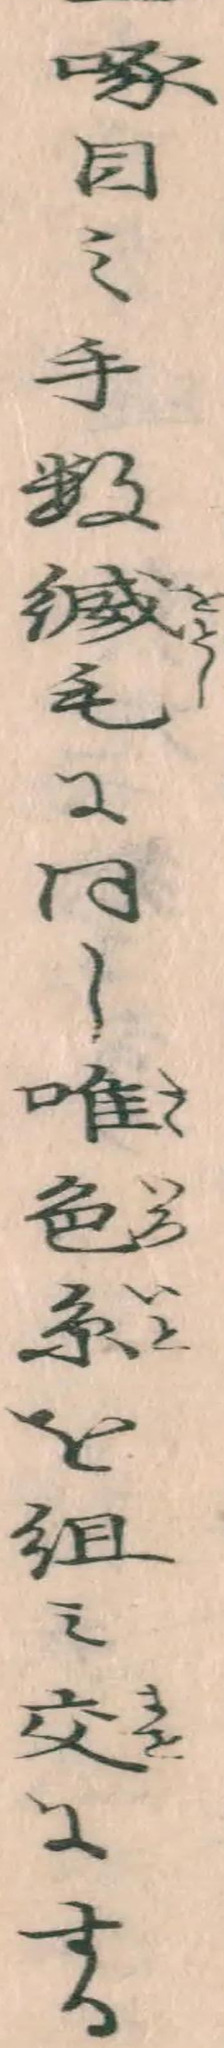一啄目之手数縅毛に同し唯色糸を組み交にする
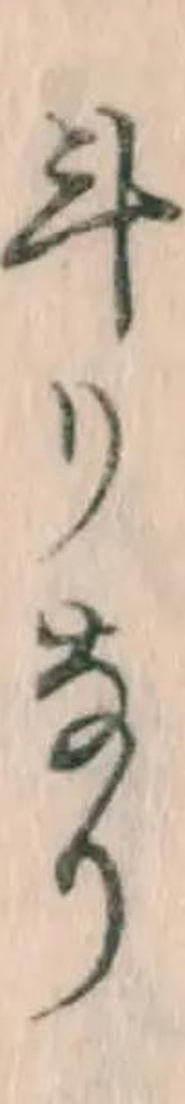斗りなり
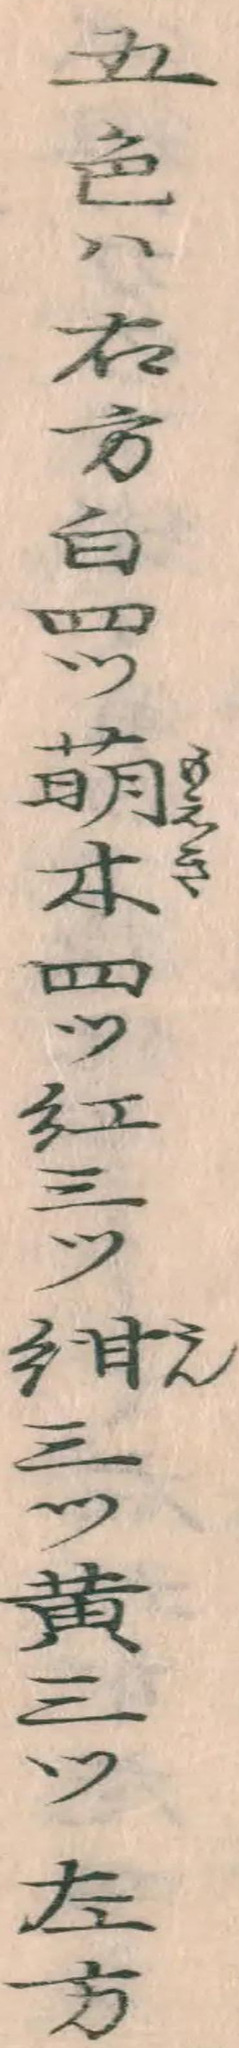一五色は右方白四ッ萌木四ッ紅三ッ紺三ッ黄三ッ左方
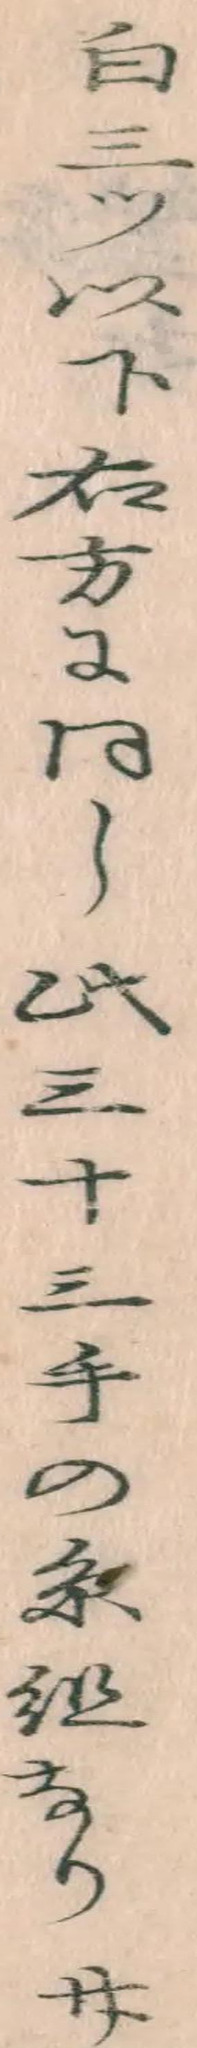白三ッ以下右方に同し此三十三手の糸組なり廿
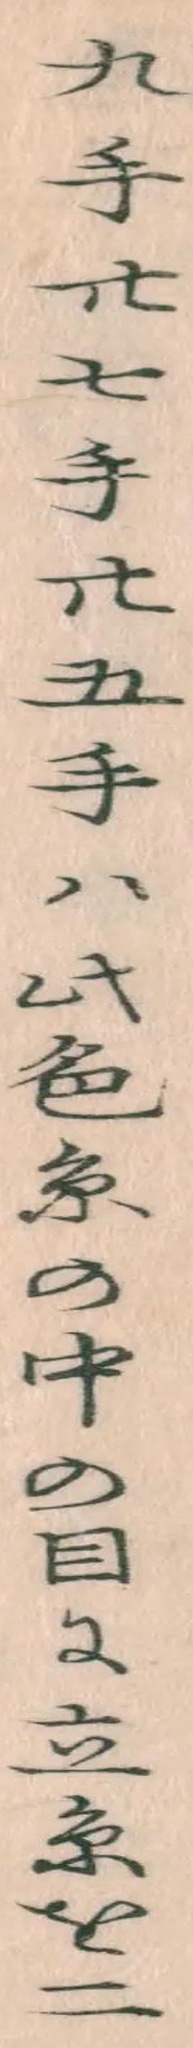九手廿七手廿五手は此色糸の中の目に立糸を二
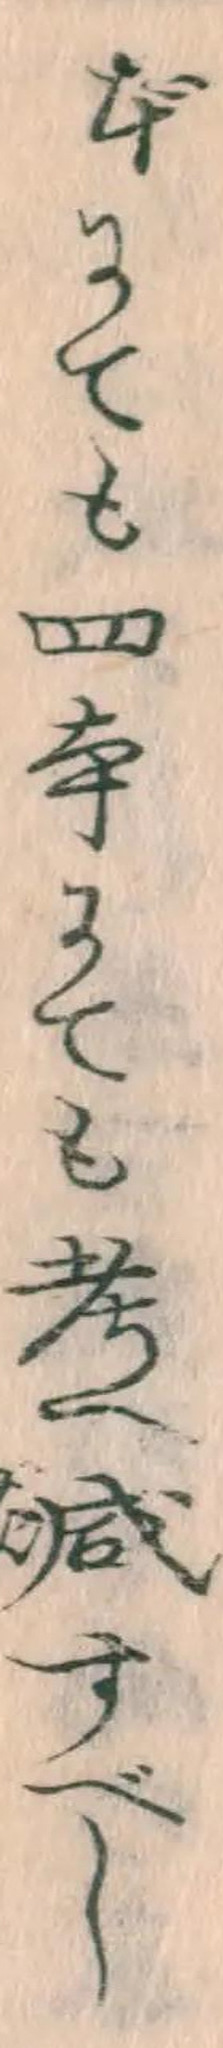本にても四本にても考へ減すべし
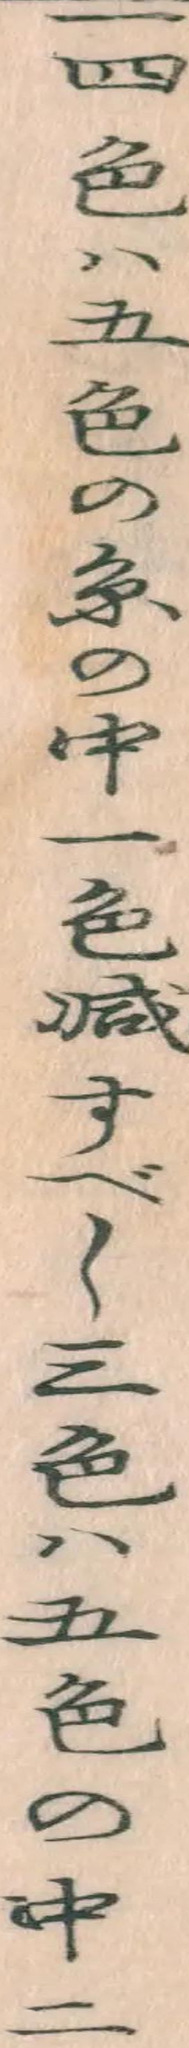一四色は五色の糸の中一色減すべし三色は五色の中二
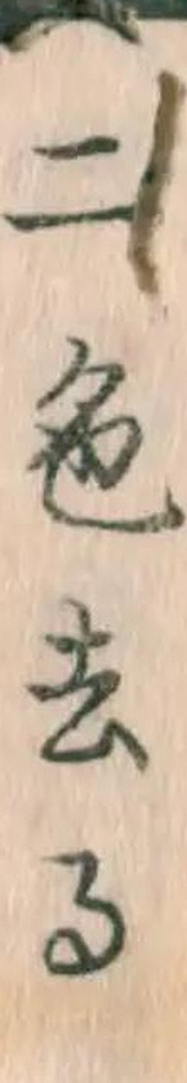二色去る
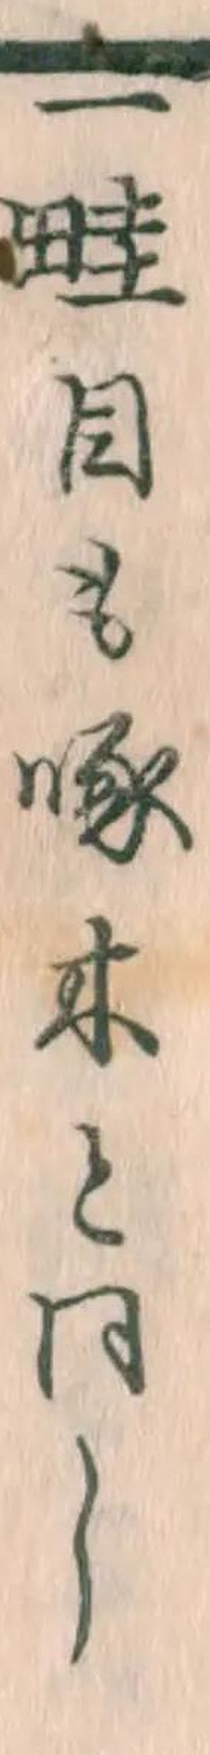一畦目も啄木と同し
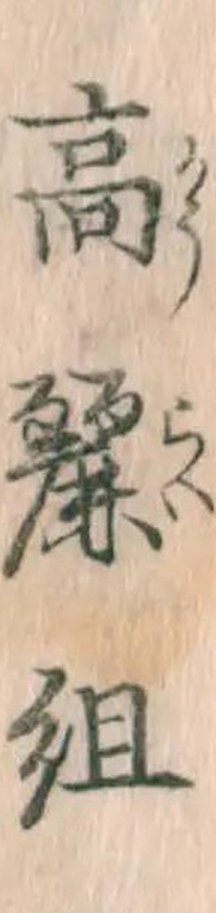高麗組
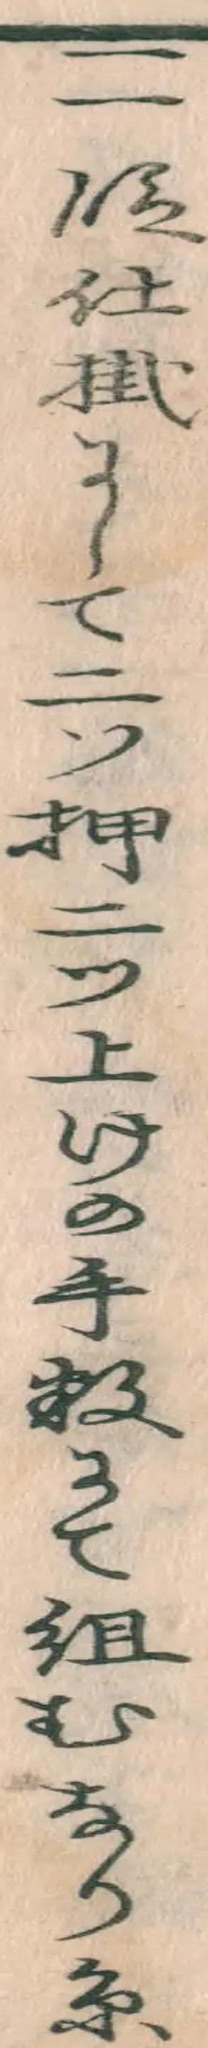一一段仕掛にして二ッ押二ッ上けの手数にて組むなり糸
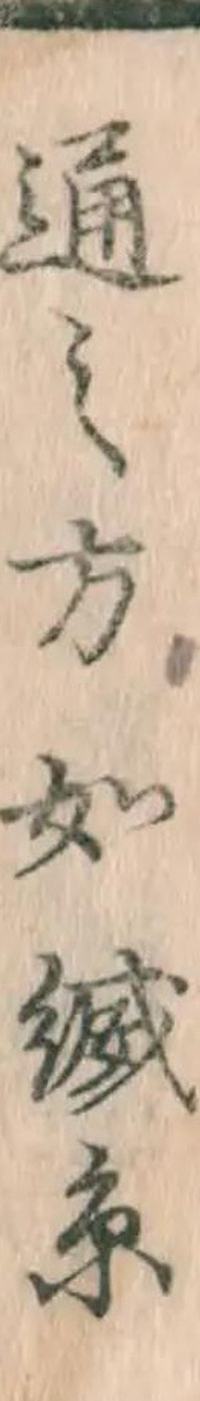通之方如縅糸

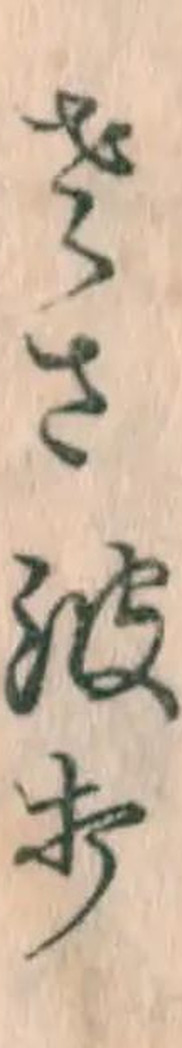ささ波打
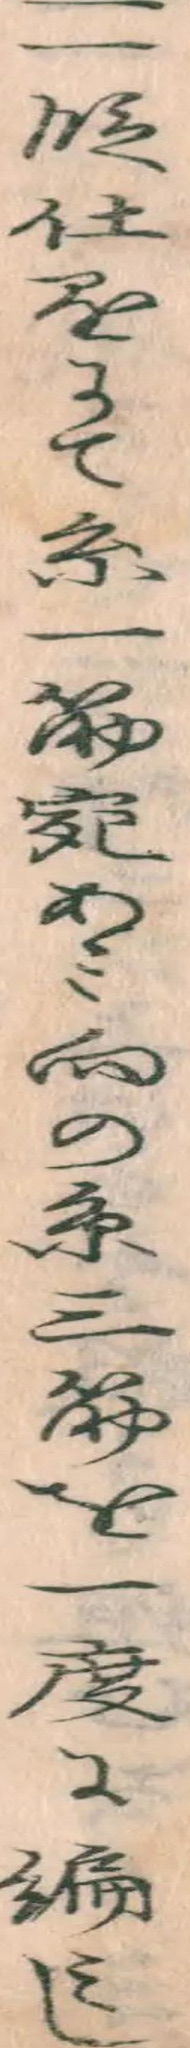一一段仕懸にて糸一筋宛あみ向の糸三筋を一度に編みし
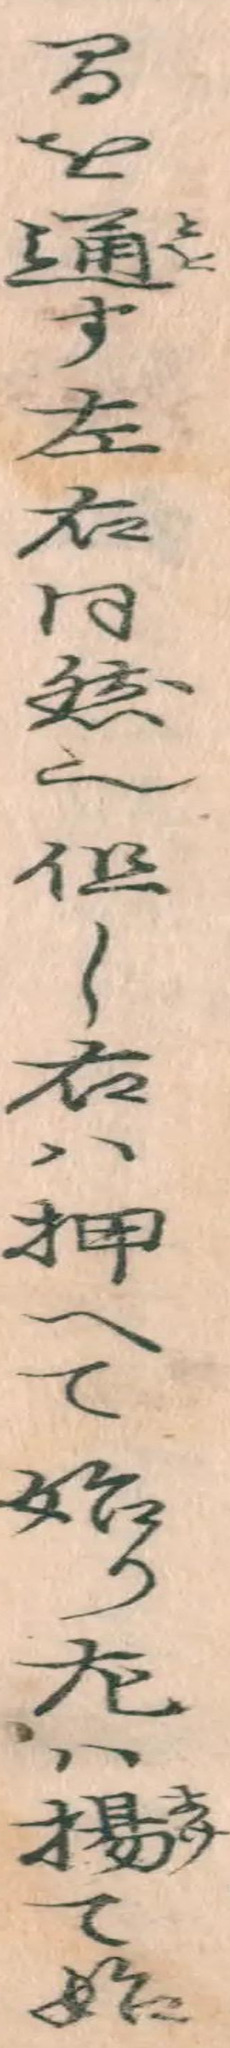間を通す左右同然也但し右は押へて始り左は揚て始
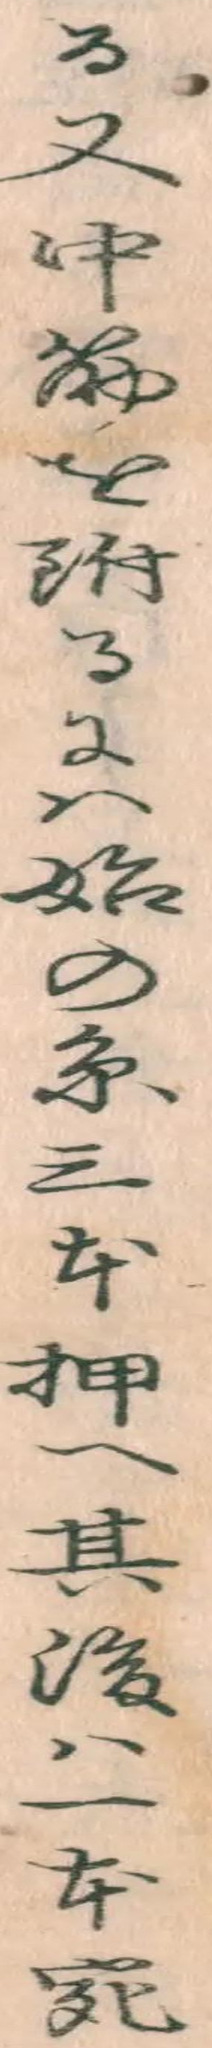る又中筋を附るには始の糸三本押へ其後は一本宛
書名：機織彙編 5巻. [2]
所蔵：国立国会図書館 National Diet Library, JAPAN
